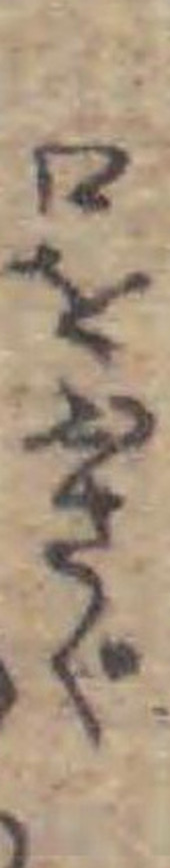口をふさぐ
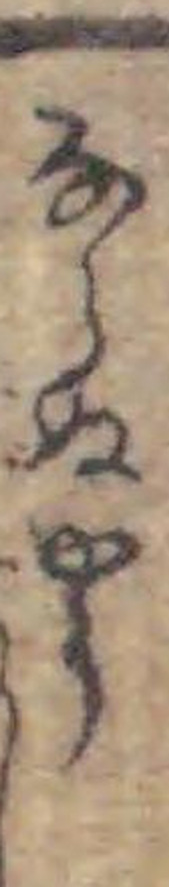ならぬやう
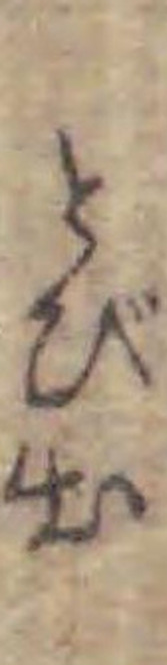とび出
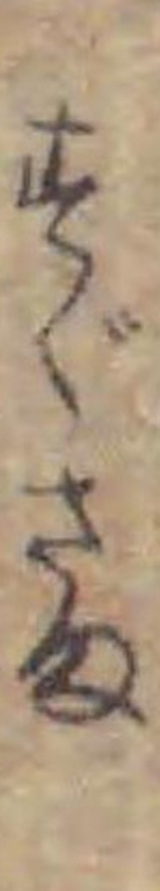すぐさま
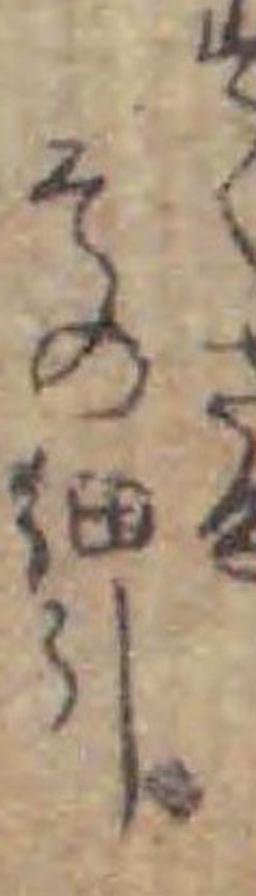その細引

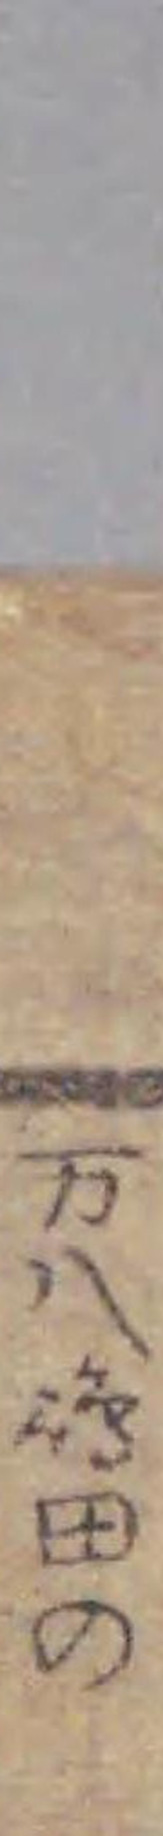万八島田の
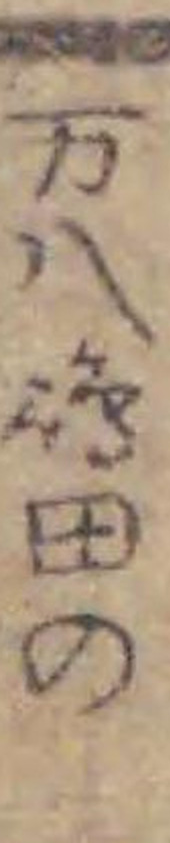万八島田の
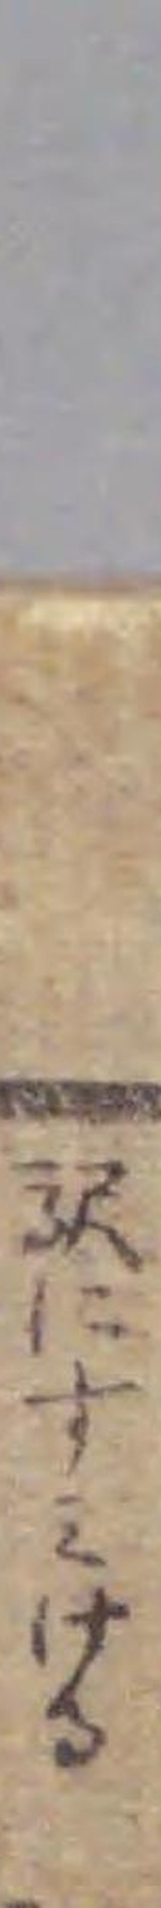駅にすみける
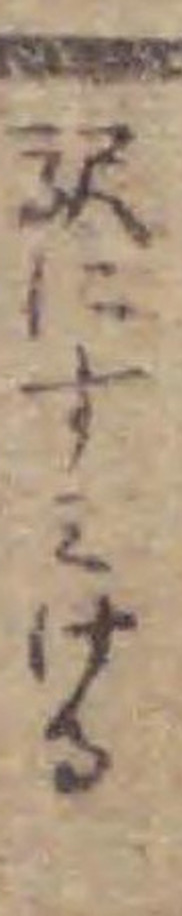駅にすみける
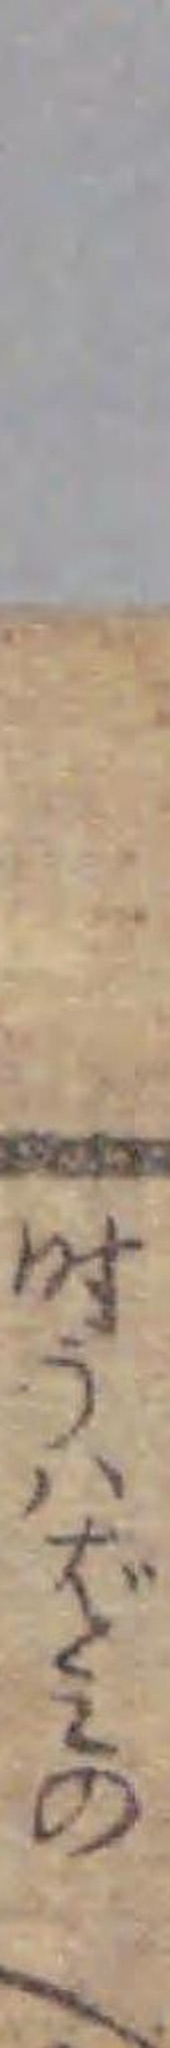時うはばみの
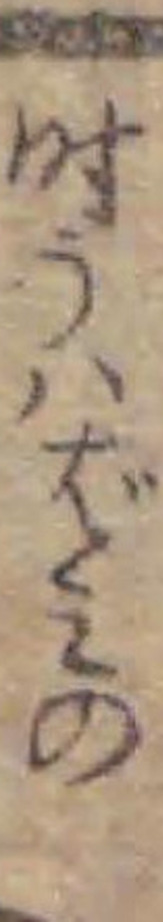時うはばみの
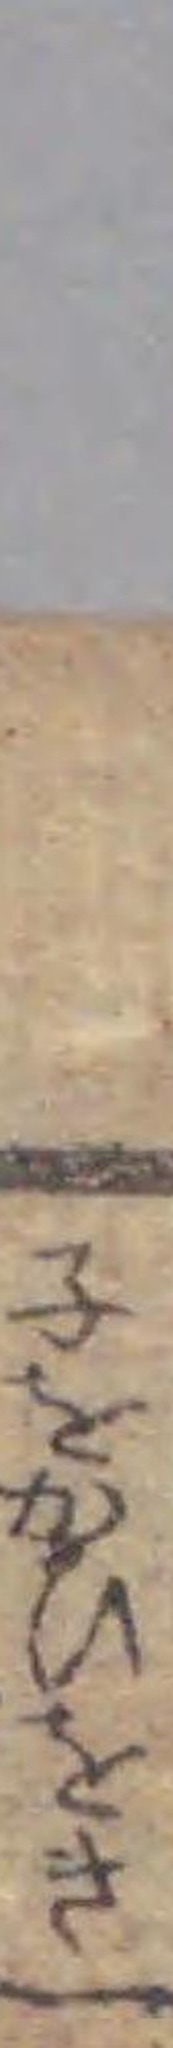子をかひをき
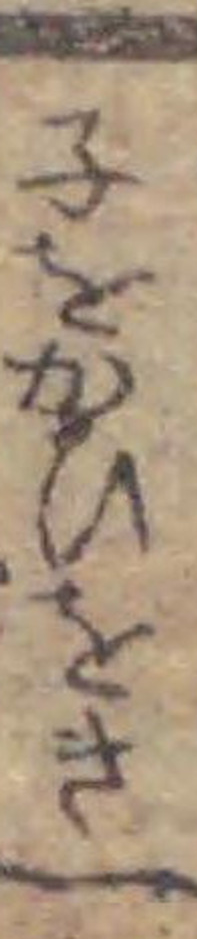子をかひをき
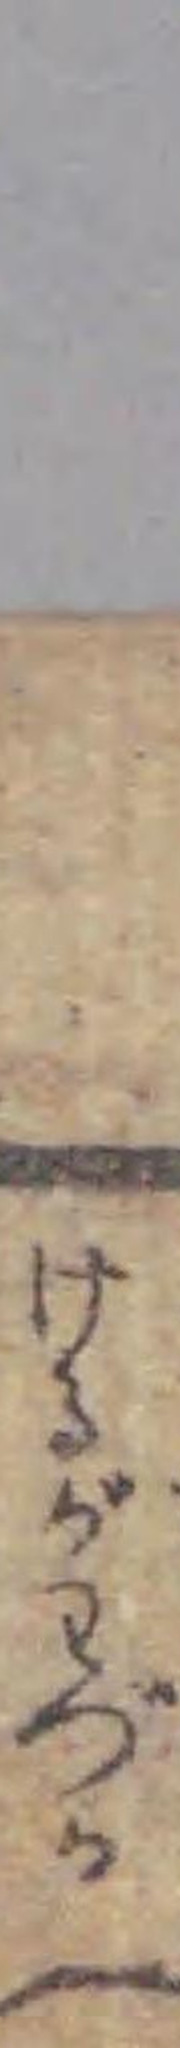けるがわづか
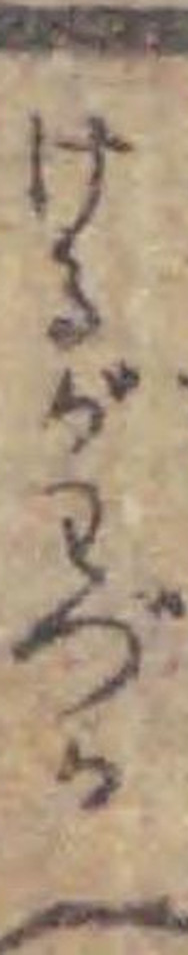けるがわづか
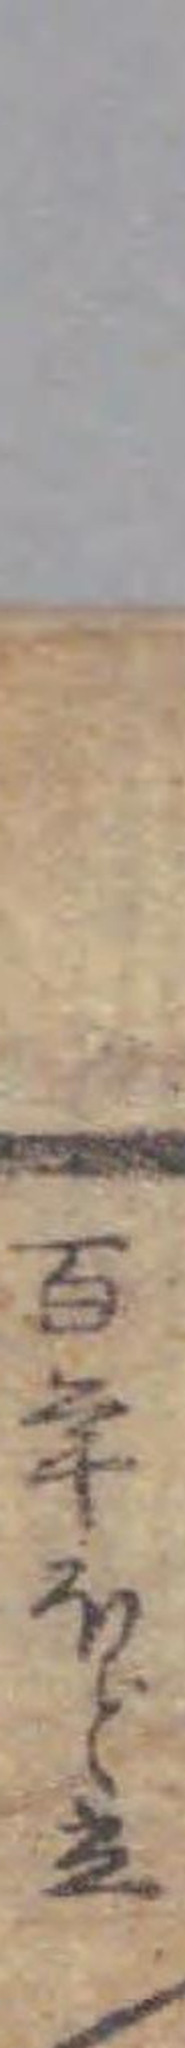百年ほど立
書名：虚言八百万八伝 : 3巻
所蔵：国立国会図書館 National Diet Library, JAPAN
